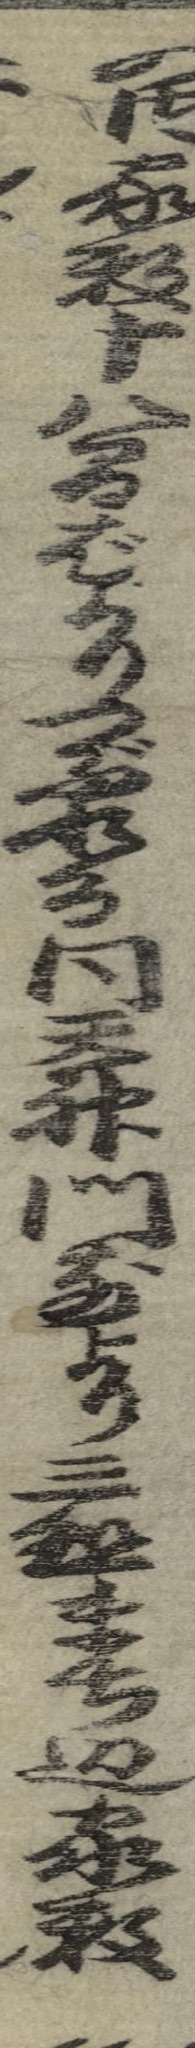の内家数十八間ばかりつぶれる同天神門前より三組まち辺家数
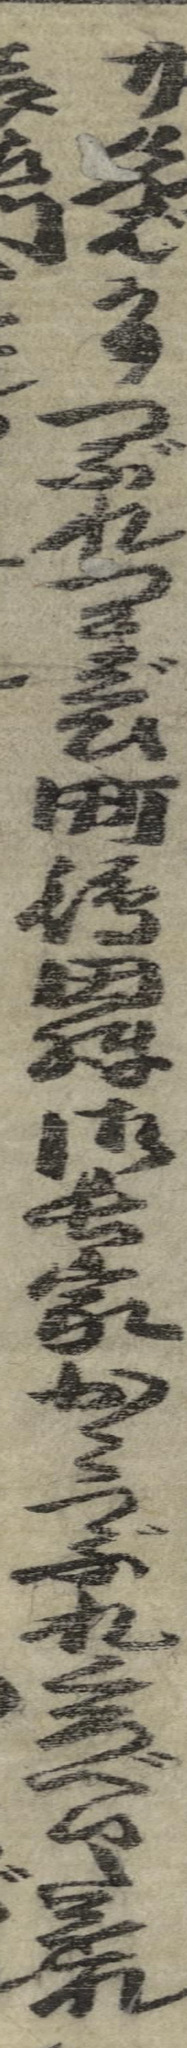廿けんばかりつぶれつまごひ町島田様御長家少々つぶれくろべいたをれ
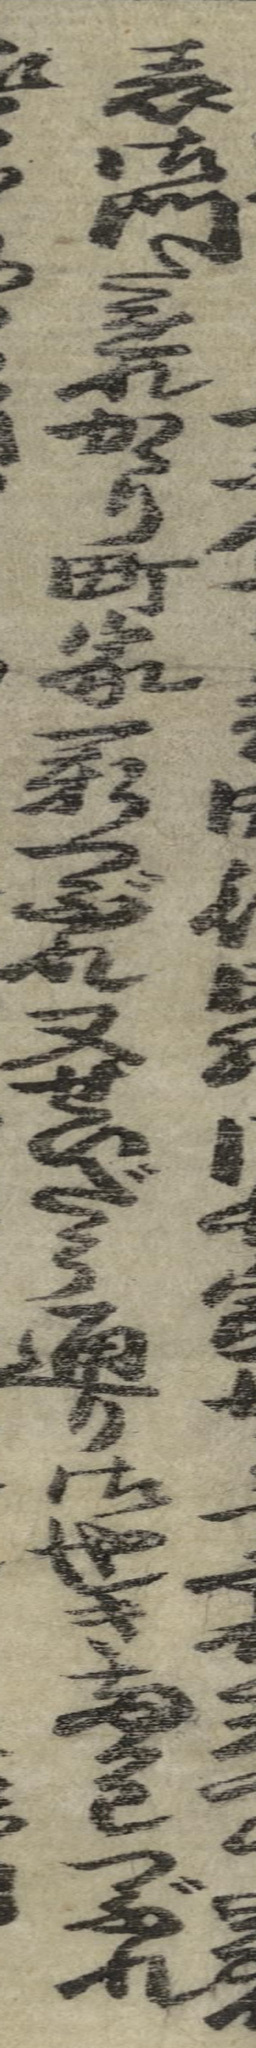表御門たをれかゝり町家一軒つぶれ又せいだう通り御やしき両かわつぶれ
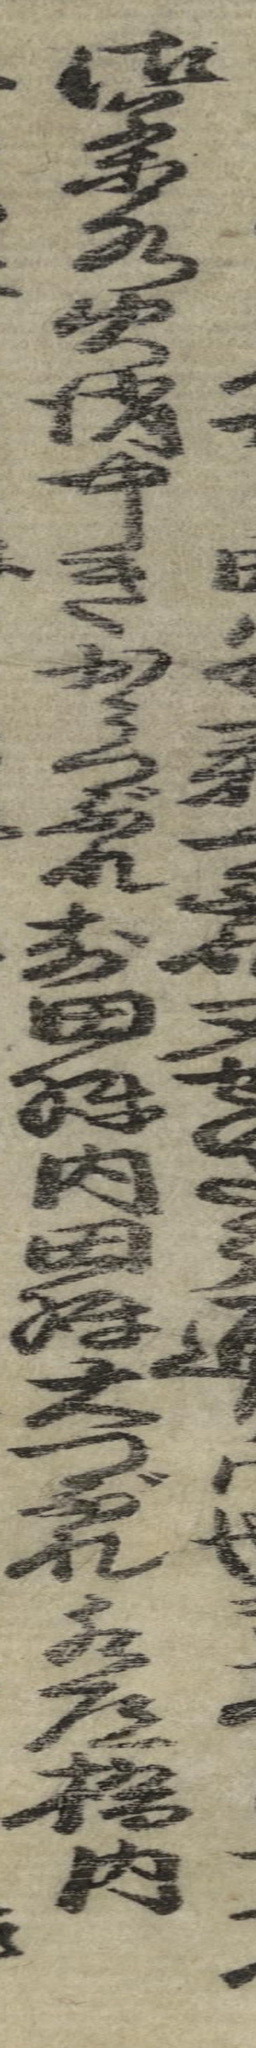御茶水火消やしきからつぶれ前田様内田様大つぶれ水道橋内
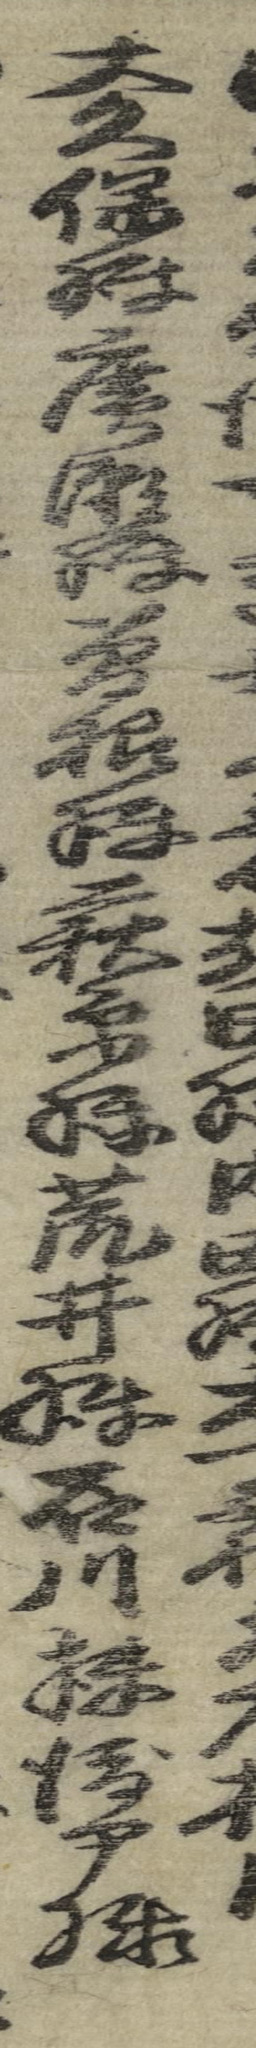大久保様広瀬様曽根様萩原様荒井様石川様渡部様
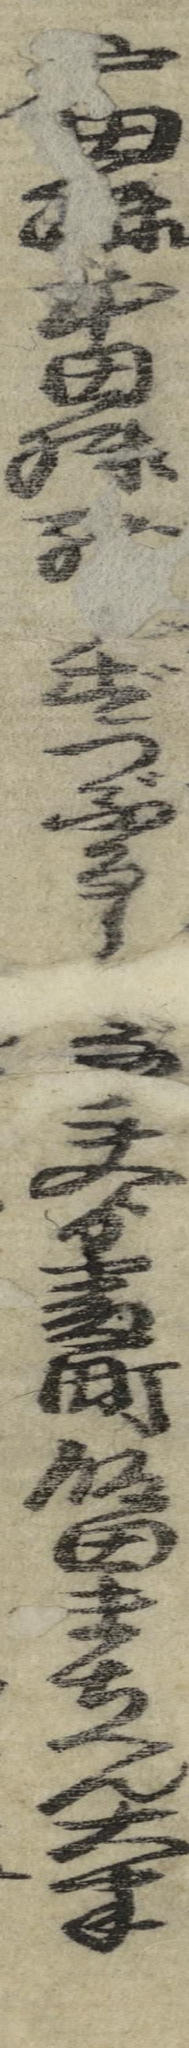戸田様本田様残ずつぶるゝな夫ゟ番町飯田まちへん大半
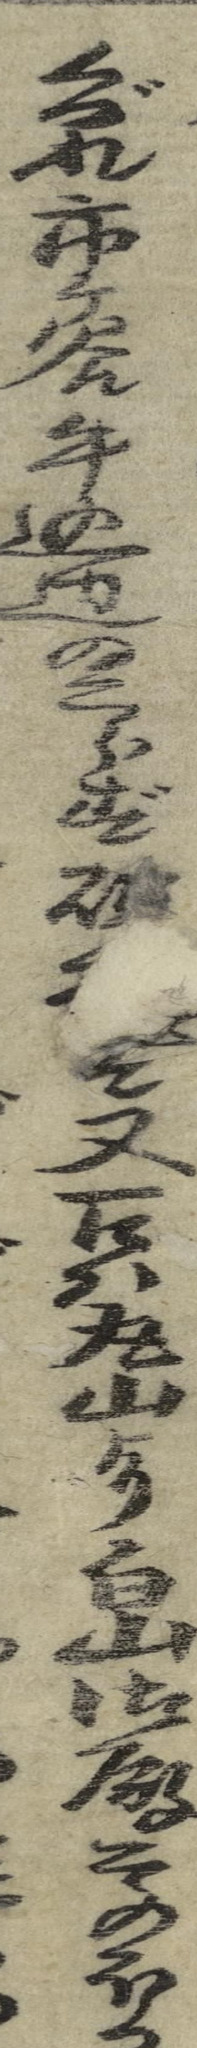くづれ市ケ谷牛込辺のこらず破す又一口ハ丸山より白山御殿そのほか
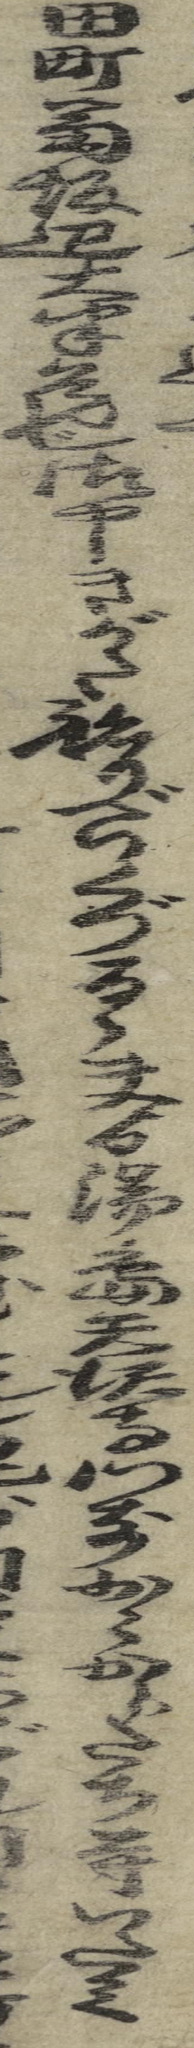田町菊坂辺大半そんじ御やしきがたねりべいくづるゝ夫ゟ湯島矢沢寺門前少々からたち寺いたみ
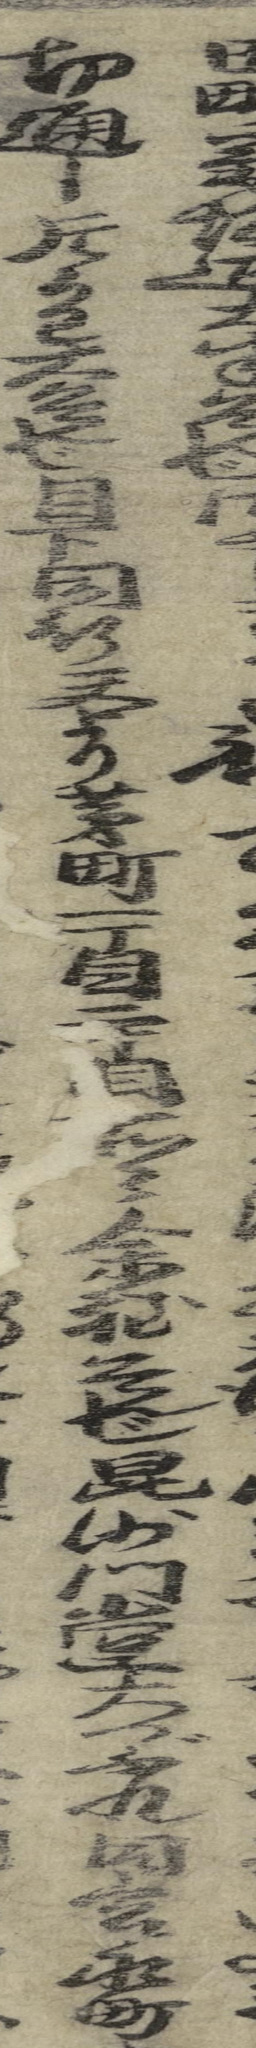切通し片かわ大そんじ目下同断夫より茅町一丁目二丁目所々余程そんじ昆沙門堂大つぶれ同宮永町大半表
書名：江戸近在　大風出水焼場附
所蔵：東京大学地震研究所図書室 Earthquake Research Institute Library, The University of Tokyo, JAPAN
